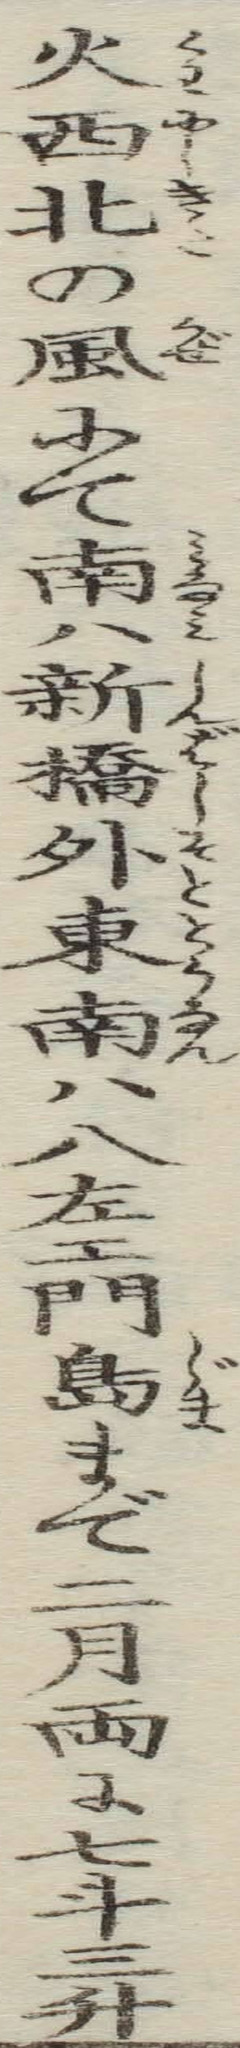火西北の風にて南は新橋外東南は八左エ門島まで二月両に七斗三升
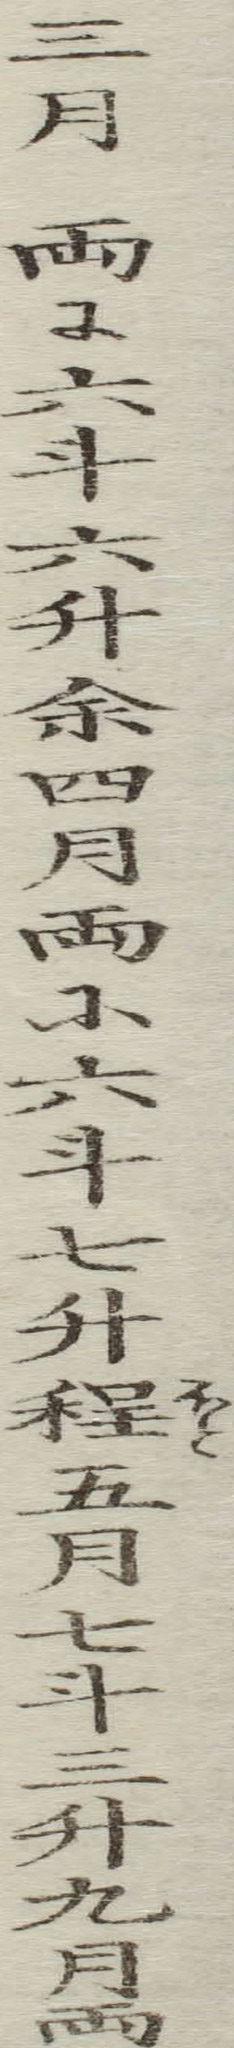三月両に六斗六升余四月両に六斗七升程五月七斗三升九月両
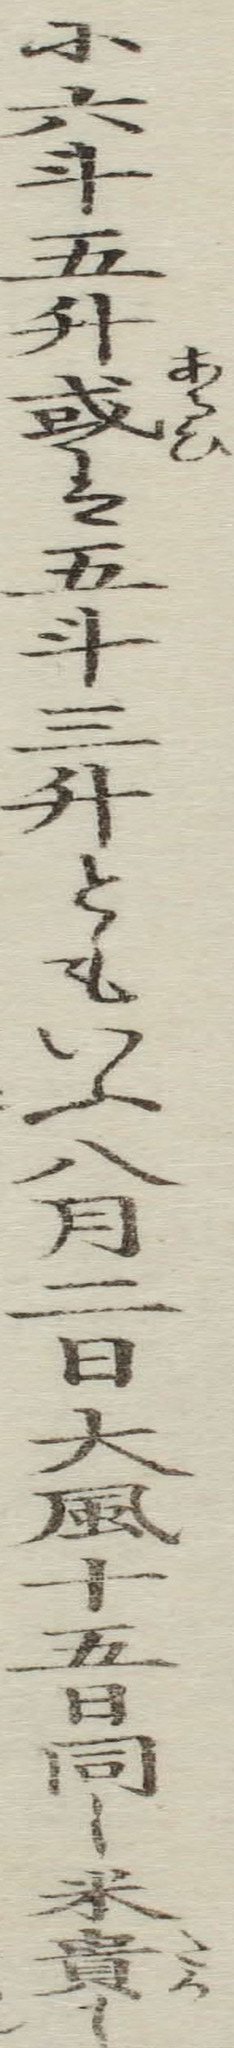に六斗五升或は五斗三升ともいふ八月二日大風十五日同し米貴し
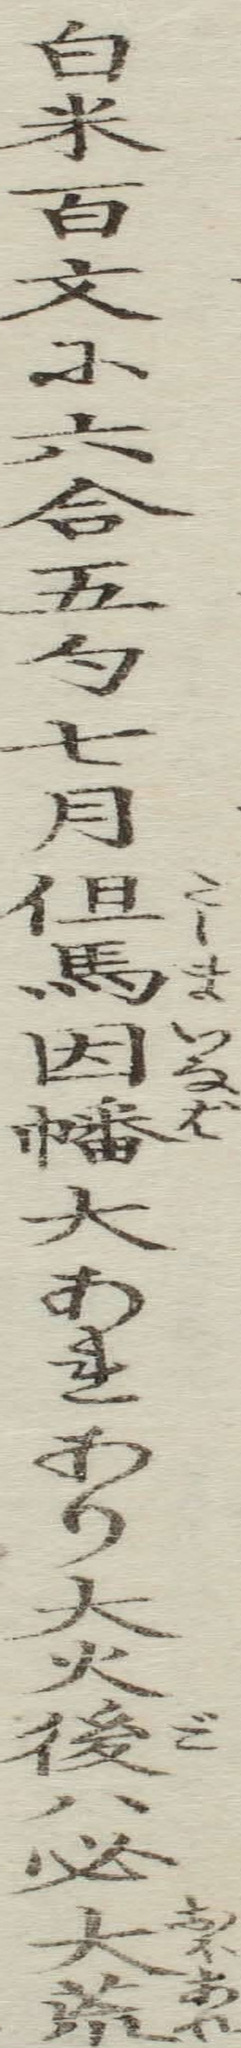白米百文に六合五勺七月但馬因幡大あれあり大火後は必大荒
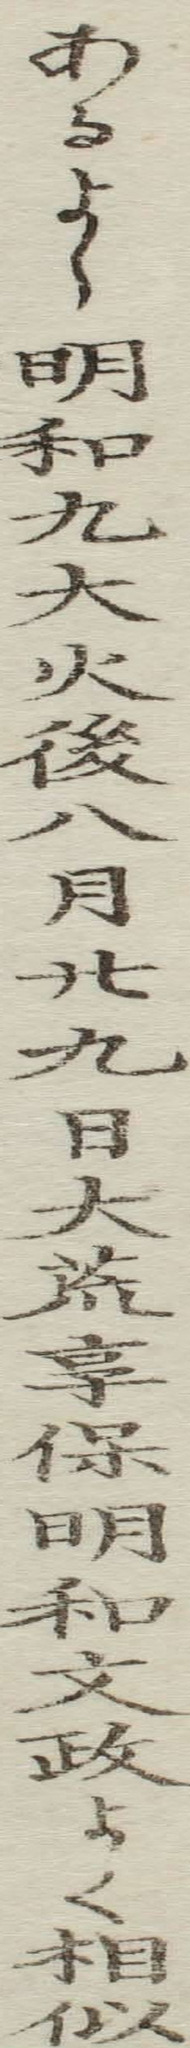あるよし明和九大火後八月廿九日大荒享保明和文政よく相似
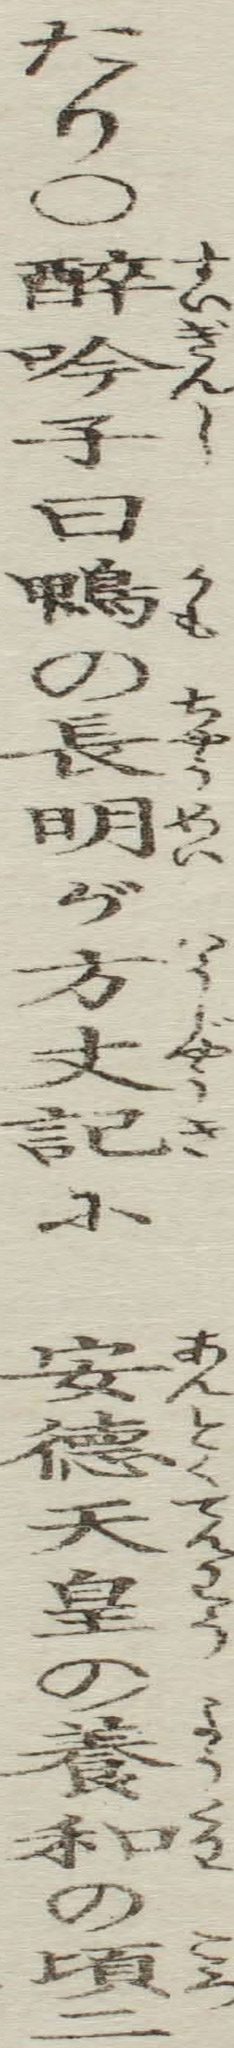たり○醉吟子曰鴨の長明が方丈記に安徳天皇の養和の頃二
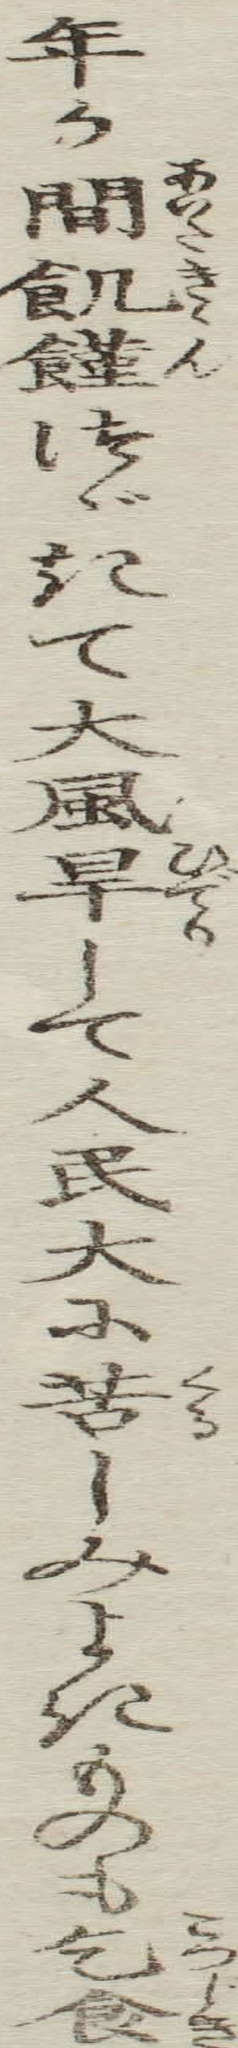年か間飢饉つゞきて大風旱して人民大に苦しみよきものも乞食
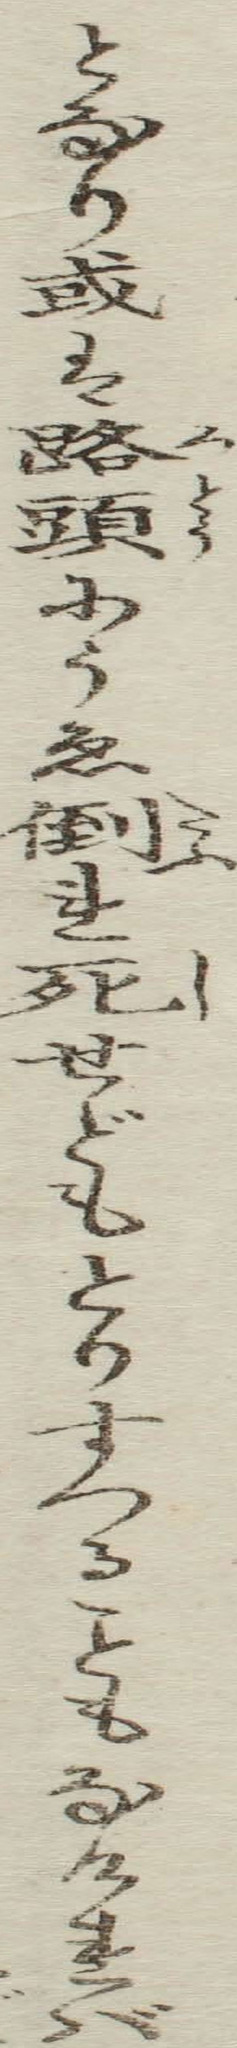となり或は路頭にうゑ倒れ死せどもとりすつることもなければ
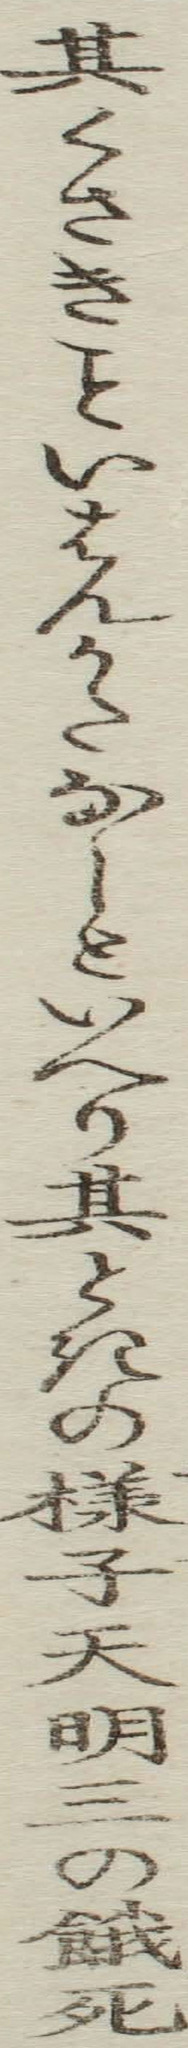其くさきこといはんかたなしといへり其ときの様子天明三の餓死

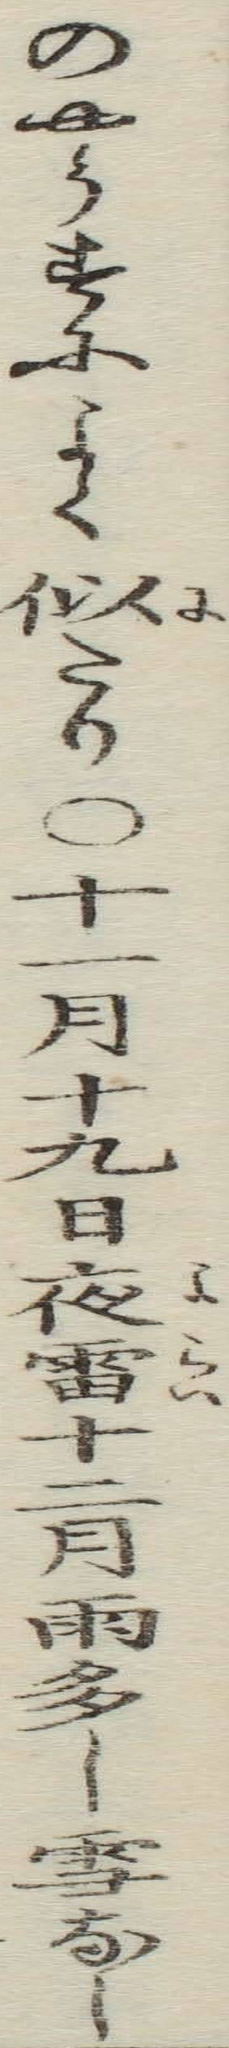のやうすによく似たり○十一月十九日夜雷十二月雨多し雪なし
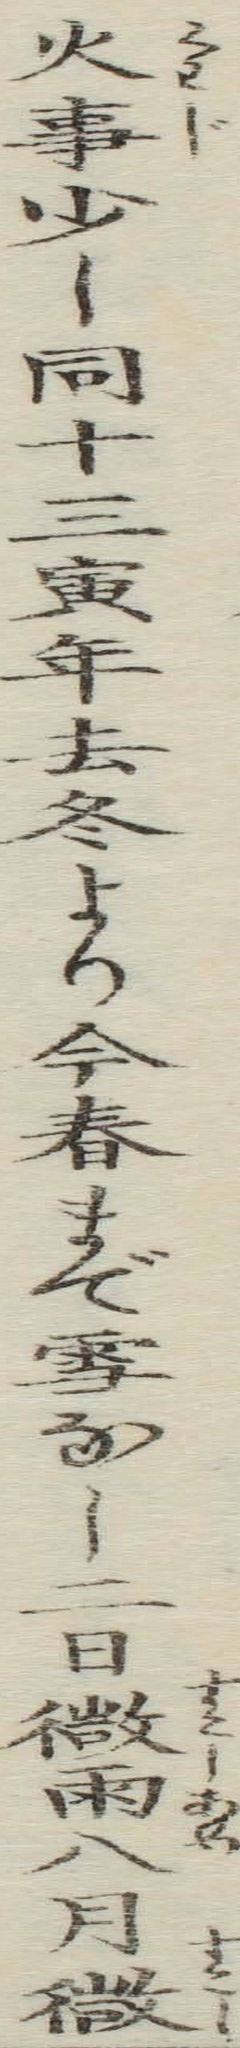火事少し同十三寅年去冬より今春まで雪なし二日微雨八月微
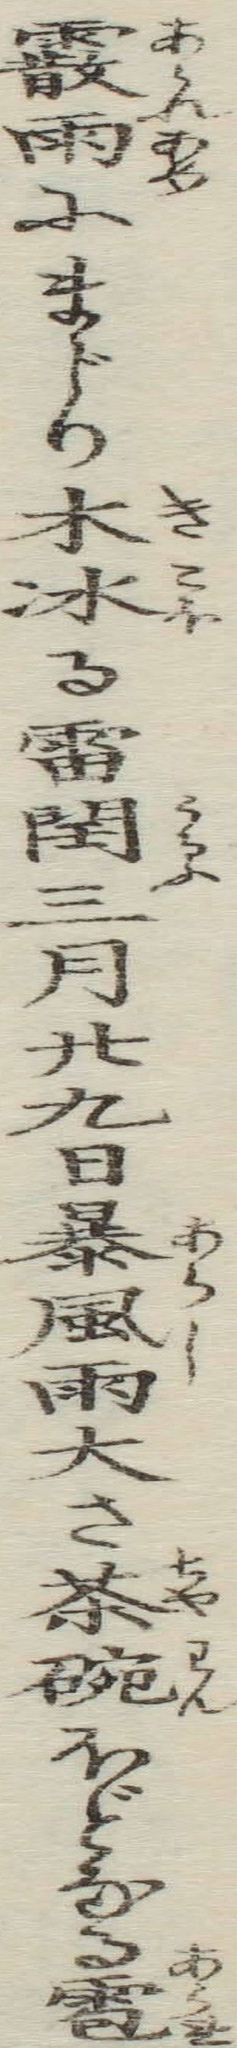霰雨にまじり木冰る雷閏三月廿九日暴風雨大さ茶碗ほどなる雹
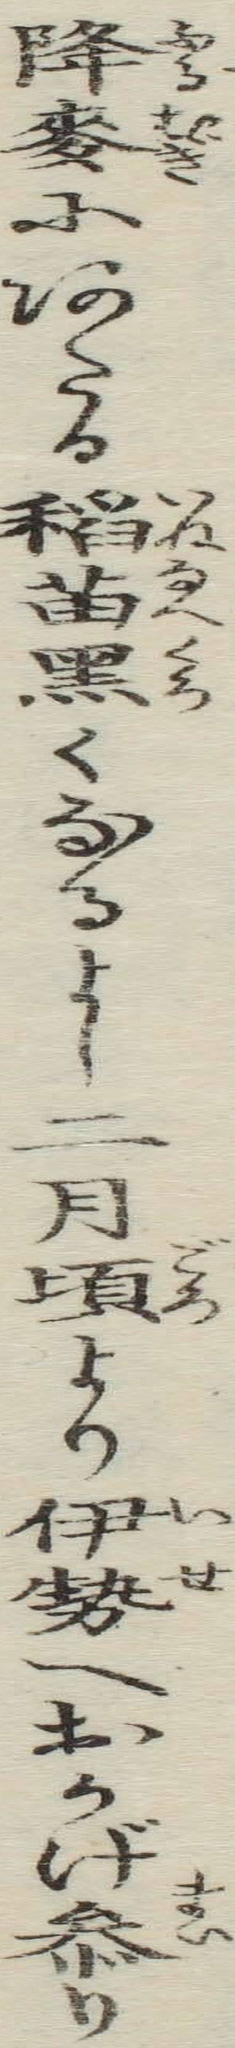降麦にあたる稲苗黒くなるよし二月頃より伊勢へおかげ参り
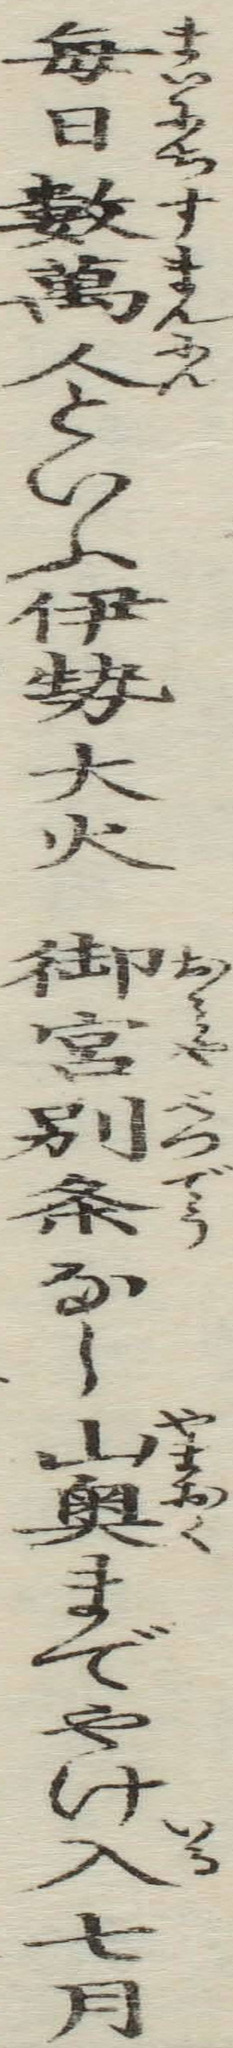毎日数万人といふ伊勢大火御宮別条なし山奥までやけ入七月
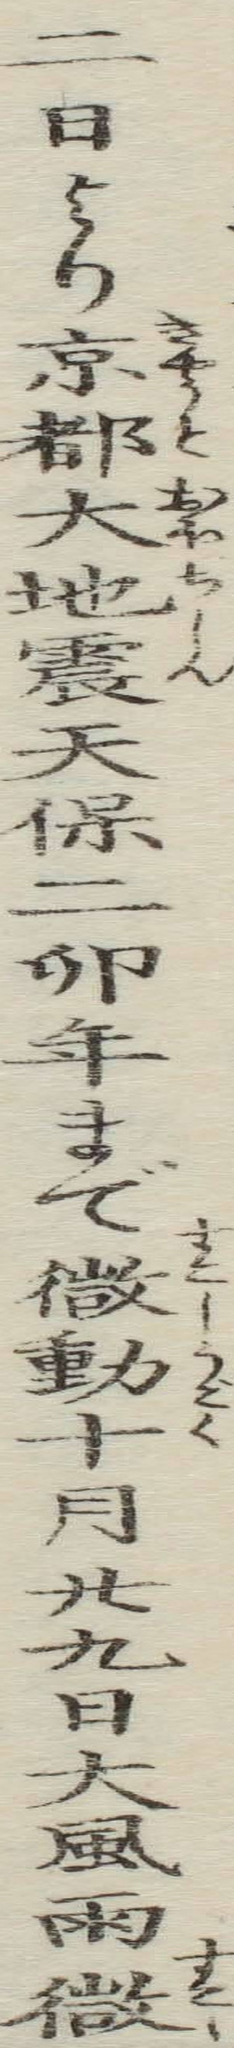二日より京都大地震天保二卯年まで微動十月廿九日大風雨微
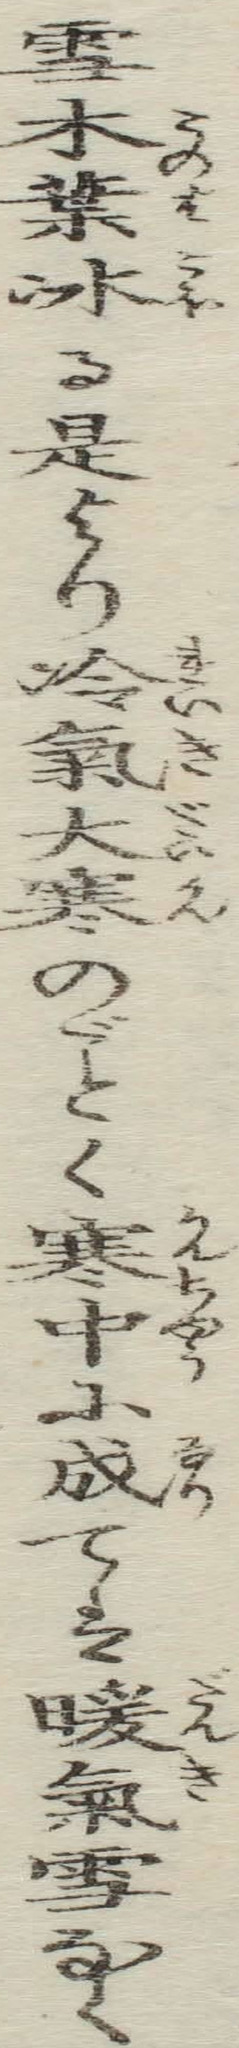雪木葉冰る是より冷気大寒のごとく寒中に成ては暖気雪なく
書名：救荒便覧
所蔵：国文学研究資料館
